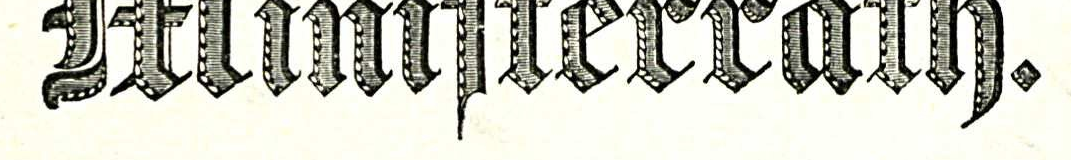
Ministerrath
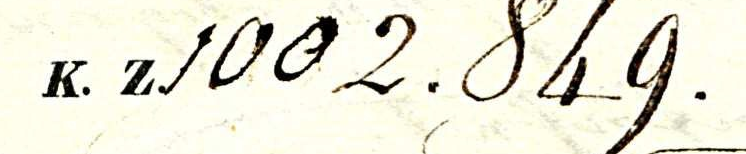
KZ 1002.[1]849
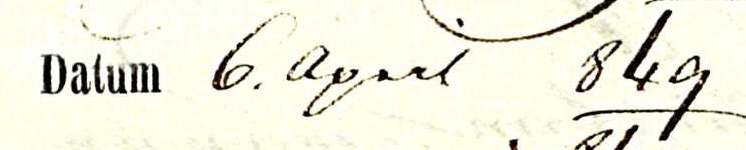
Datum 6. April[1]849
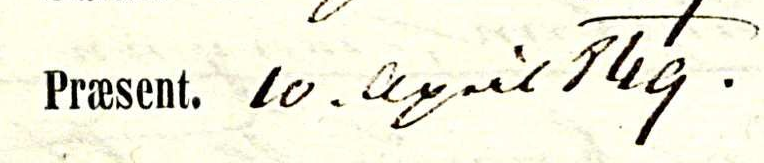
Praesent. 10. April [1]849
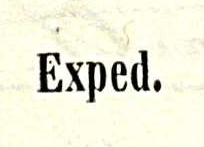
Exped.
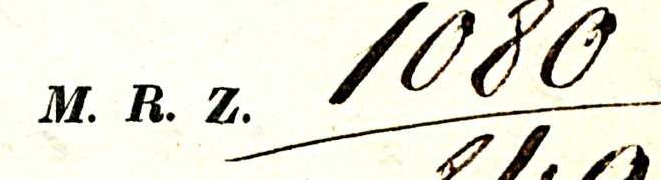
M.R. Z. 1080
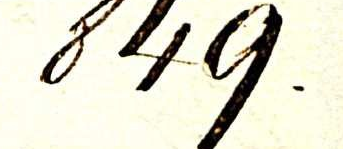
849
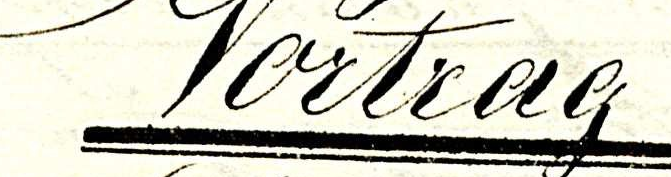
Vortrag
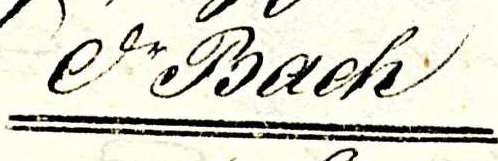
Dr. Bach
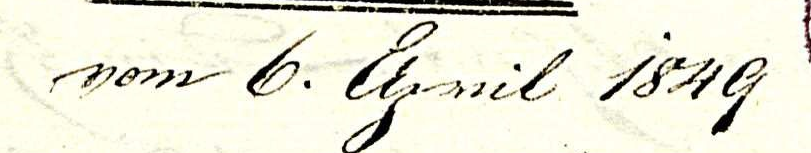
vom 6. April 1849
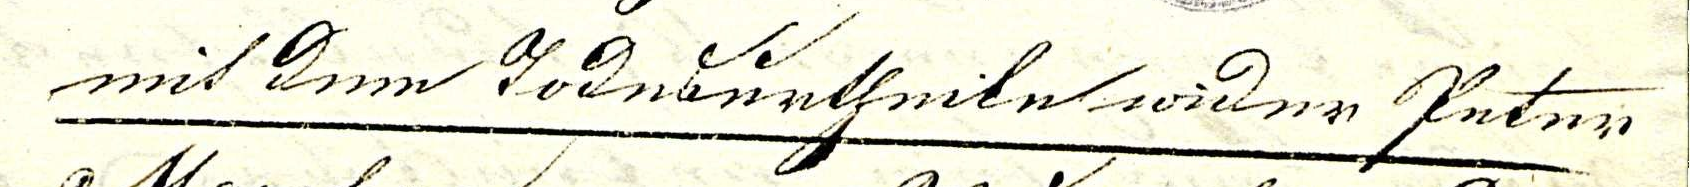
Mit dem Todesurtheile wider Peter
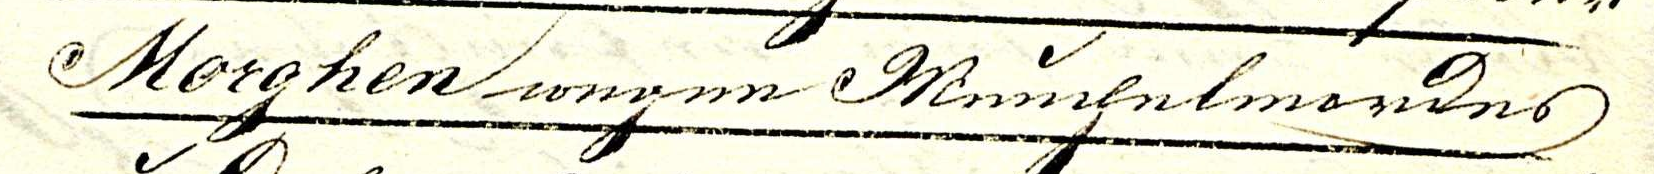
Morghen wegen Meuchelmordes
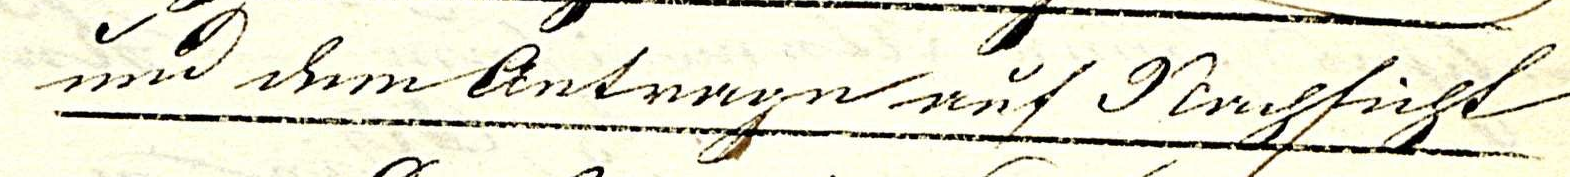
und dem Antrage auf Nachsicht
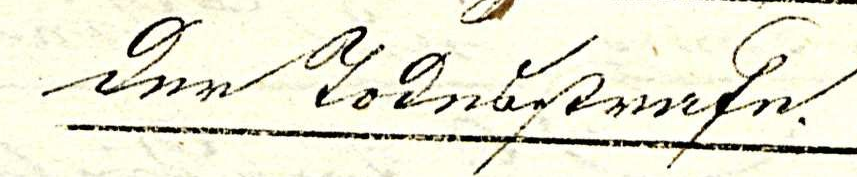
der Todesstrafe.
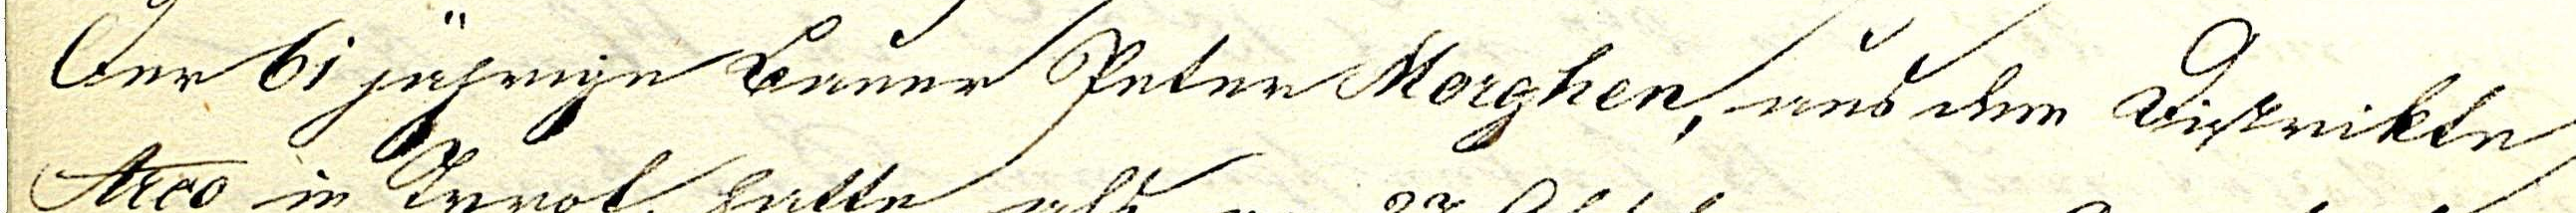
Der 61jährige Bauer Peter Morgehn, aus dem Distrikte
